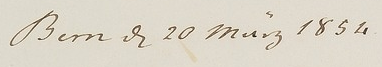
Bern den 20 März 1854
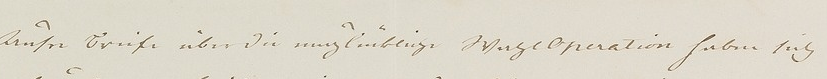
Unsre Briefe über die unglückliche Wahl Operation haben sich
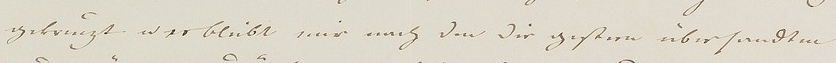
gekreuzt u es bleibt mir nach den Dir gestern übersandten
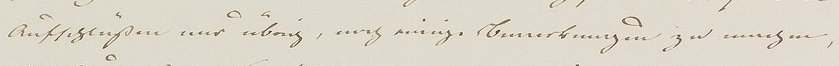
Aufschlüßen nur übrig, noch einige Bemerkungen zu machen,
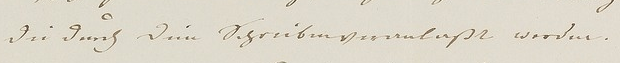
die durch Dein Schreiben veranlaßt werden.
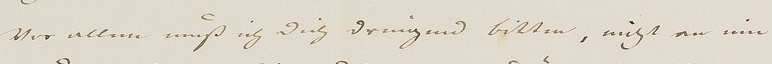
Vor allem muß ich Dich dringend bitten, nicht an eine
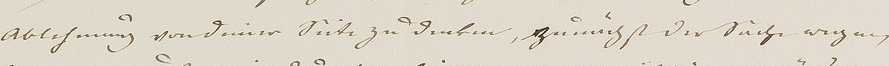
Ablehnung von deiner Seite zu denken, zunächst der Sache wegen,
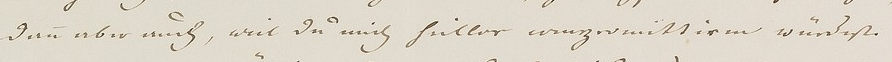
dann aber auch, weil du mich heillos compromittiren würdest.
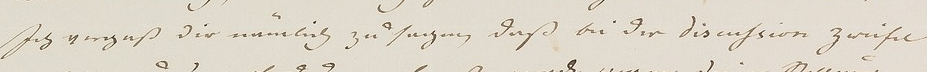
Ich vergaß dir nämlich zu sagen, daß bei der Discussion Zweifel
